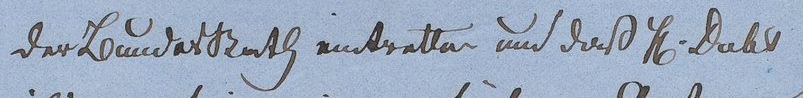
der BundesRath eintretten und daß H. Dubs
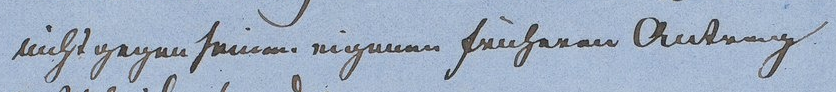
nicht gegen seinen eigenen früheren Antrag
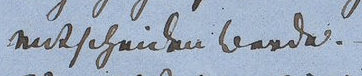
entscheiden werde. –
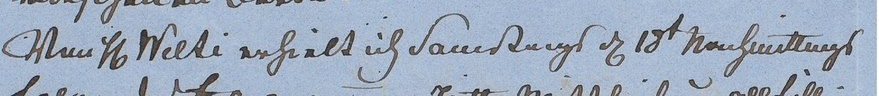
Von H. Welti erhielt ich Samstags d 18t Nachmittags
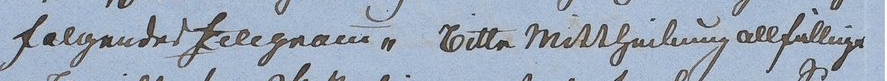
folgendes Telegramm «Bitte Mittheilung allfällige
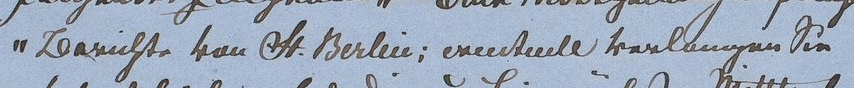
Berichte von St. Berlin; eventuell verlangen Sie
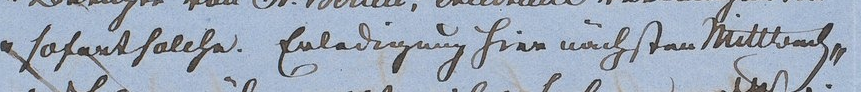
sofort solche. Erledigung hier nächsten Mittwoch»
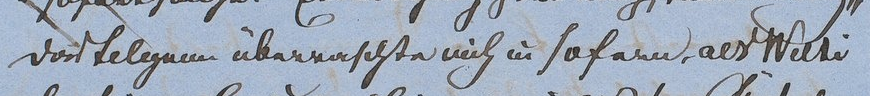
Das Telegramm überraschte mich insofern, als Welti
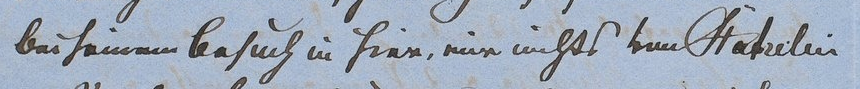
bei seinem Besuch in hier, mir nichts von Stähelin
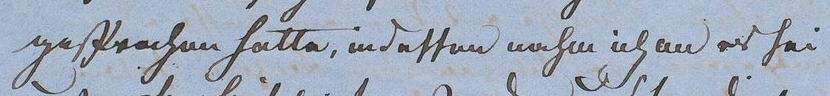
gesprochen hatte, indessen nahm ich an es sei
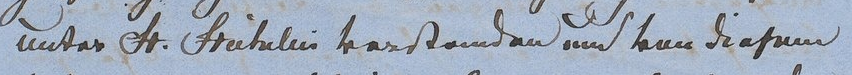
unter St. Stähelin verstanden und von diesem
